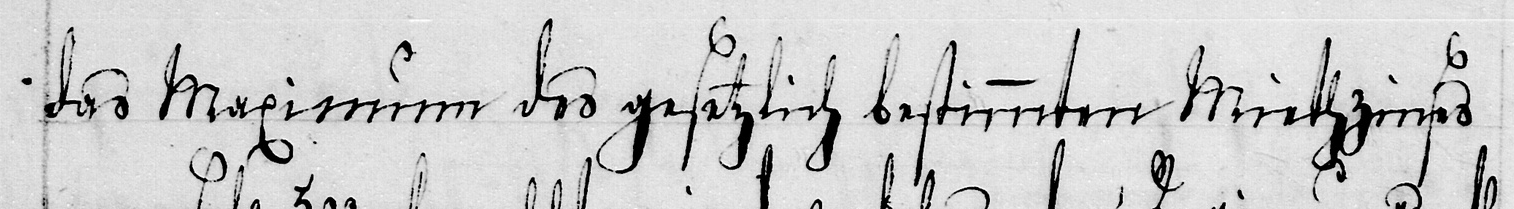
das Maximum des gesetzlich bestimmten Miethzinses
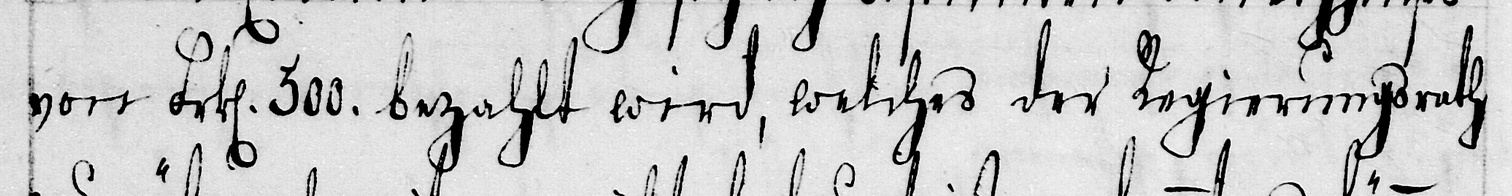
von Frk[en]. 500. bezahlt wird, welches der Regierungsrath
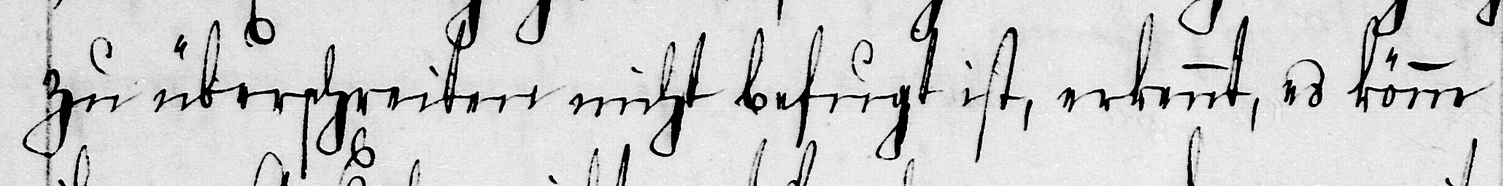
zu überschreiten nicht befugt ist, erkennt, es könne
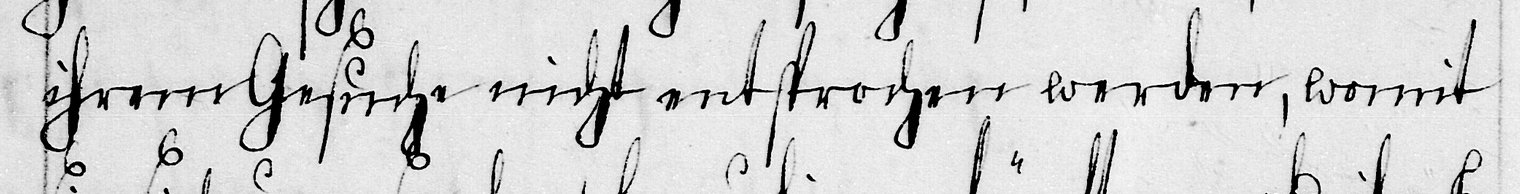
ihrem Gesuche nicht entsprochen werden, womit
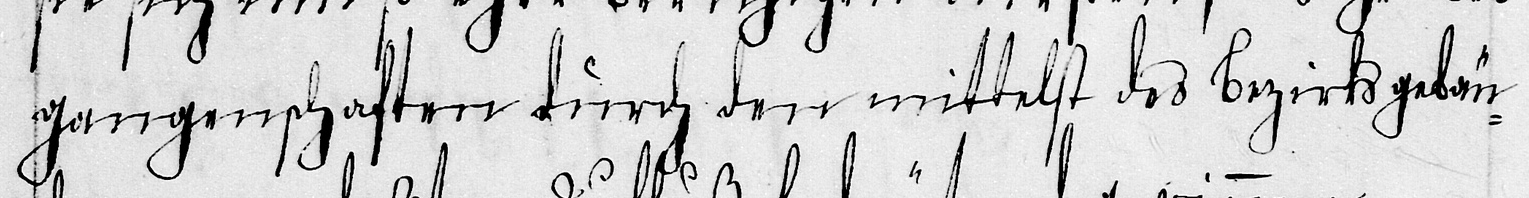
gangenschaften durch den mittelst des Bezirksgebäu¬
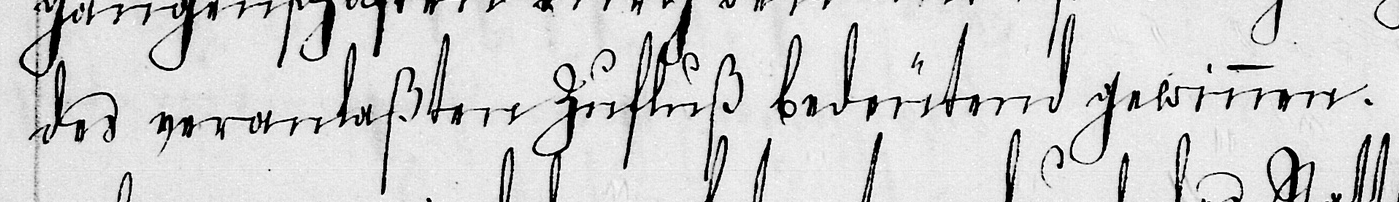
des veranlaßten Zufluß bedeutend gewinnen.
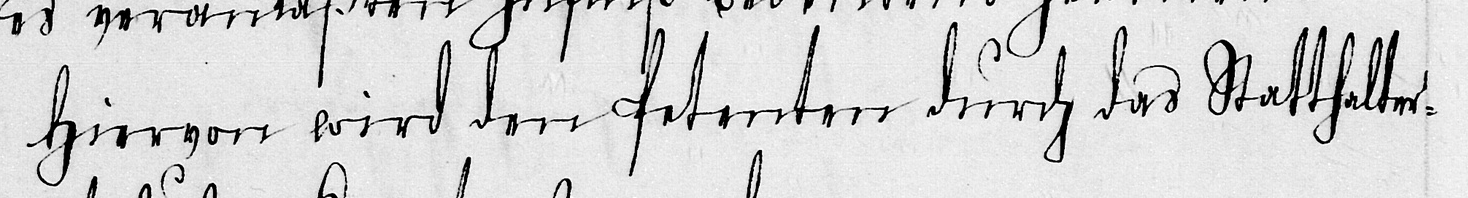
Hiervon wird den Petenten durch das Statthalt¬
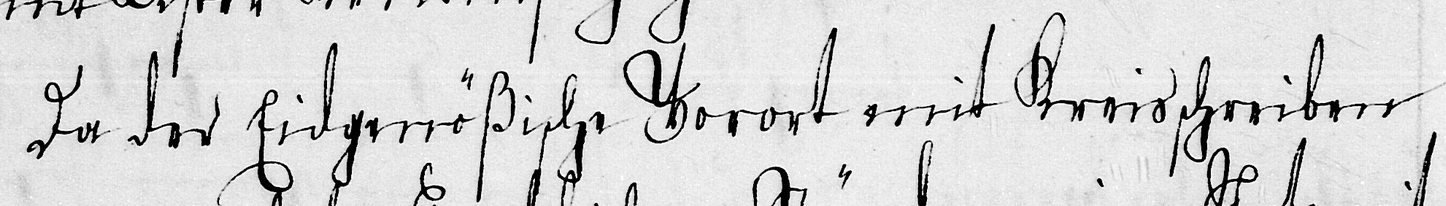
Da der Eidgenößische Vorort mit Kreisschreiben
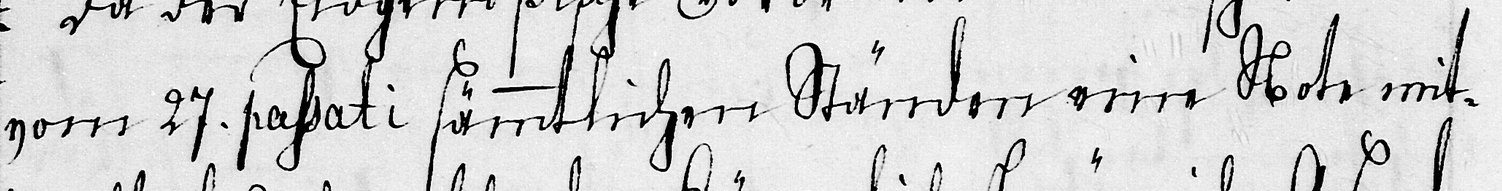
vom 27. passati sämmtlichen Ständen eine Note mit¬
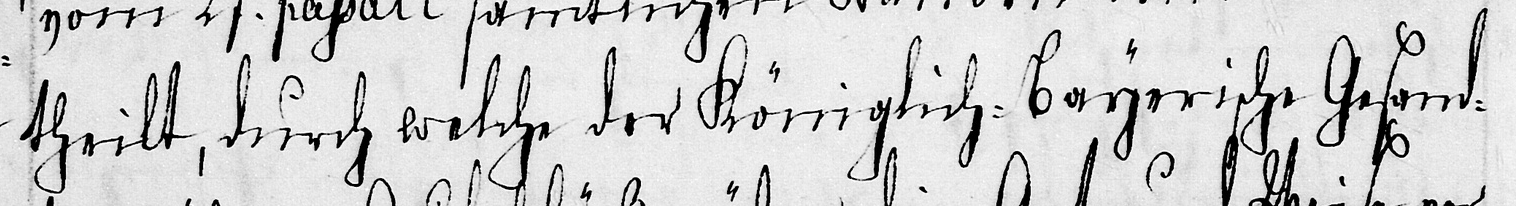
theilt, durch welche der Königlich-Bayerische Gesand¬
